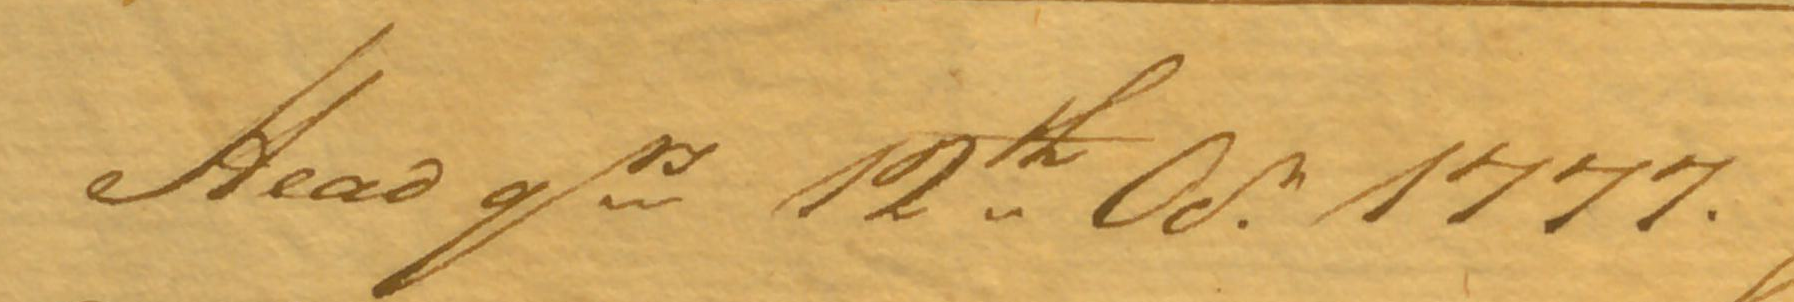Head q^rs. 12^th. Oc^r. 1777.
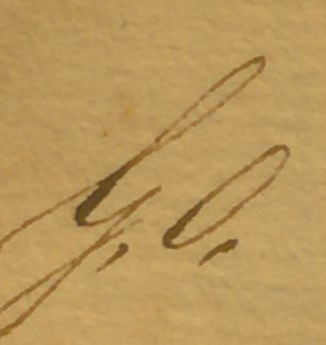G.O.
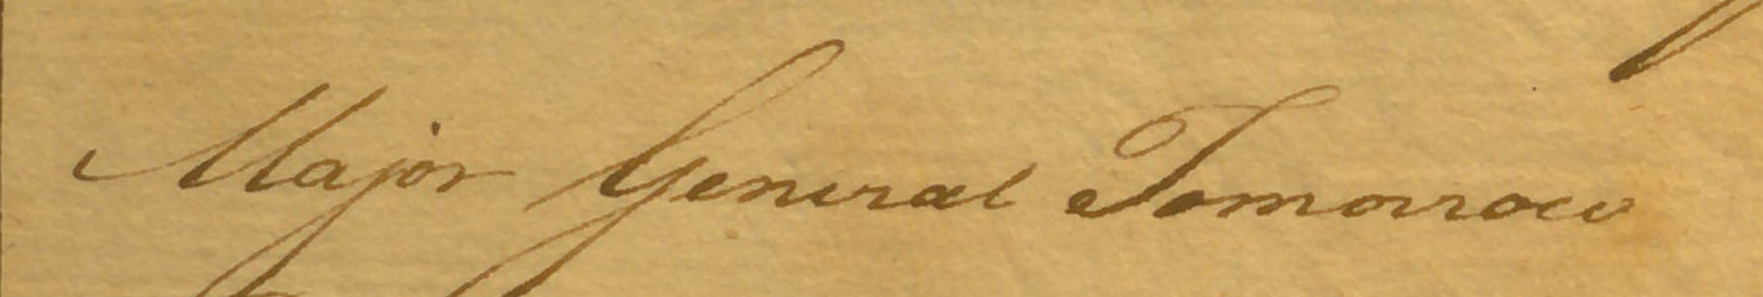Major General Tomorrow
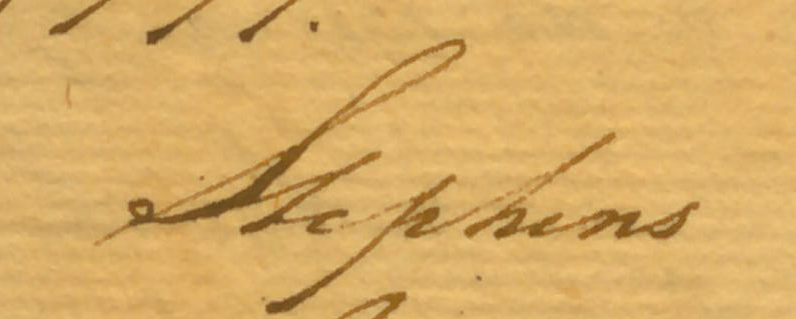Stephens
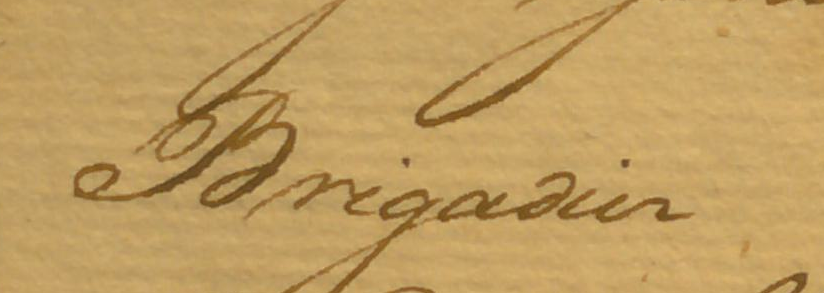Brigadier
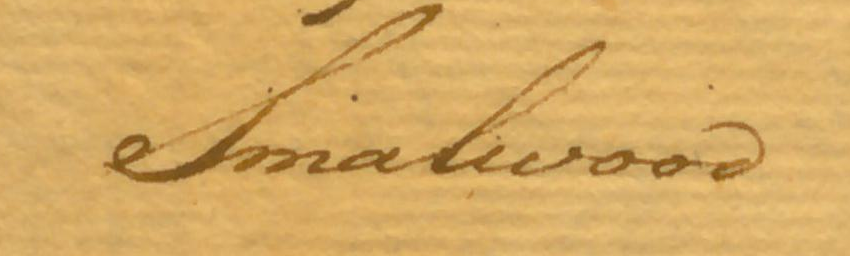Smalwood
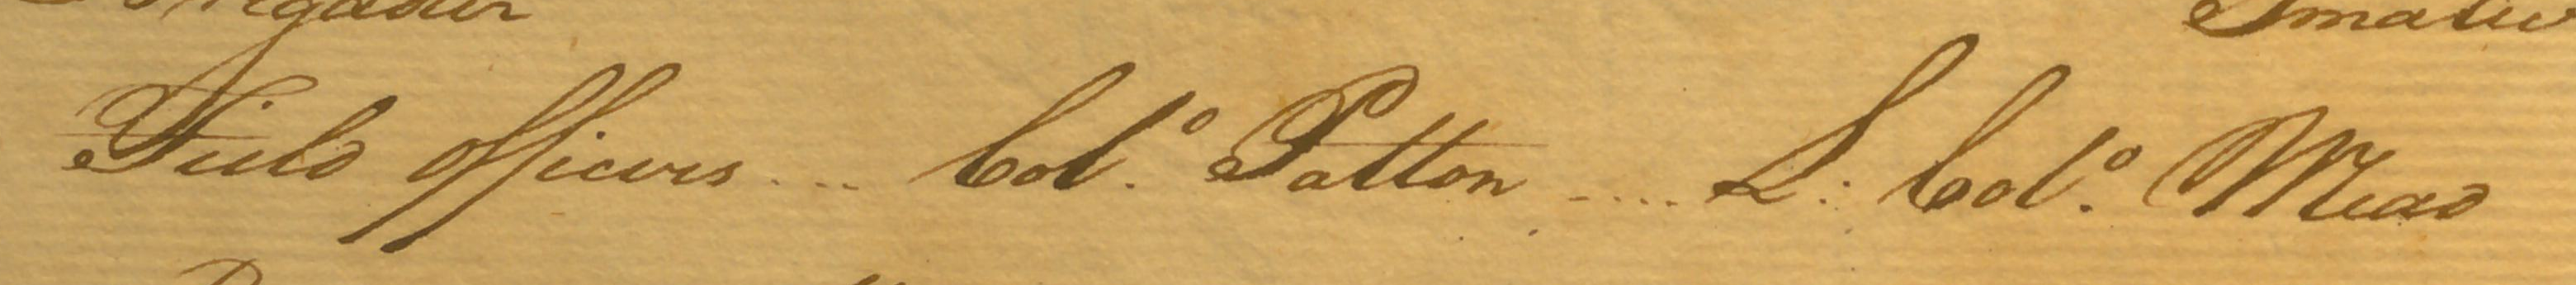Field officers... Col^o. Patton... L: Col^o. Mead
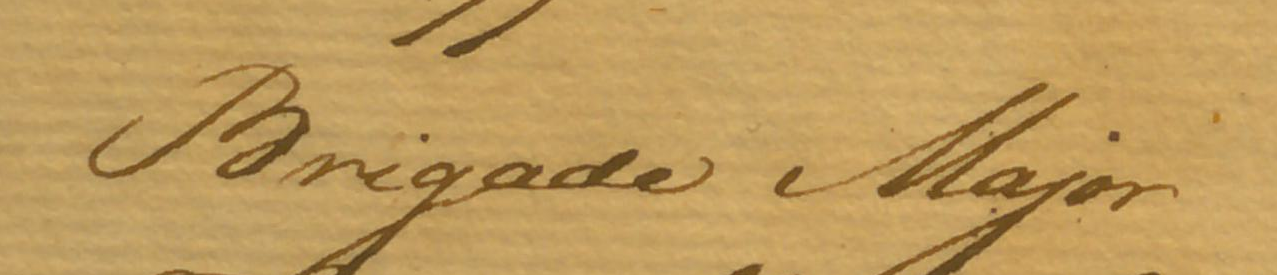Brigade Major
